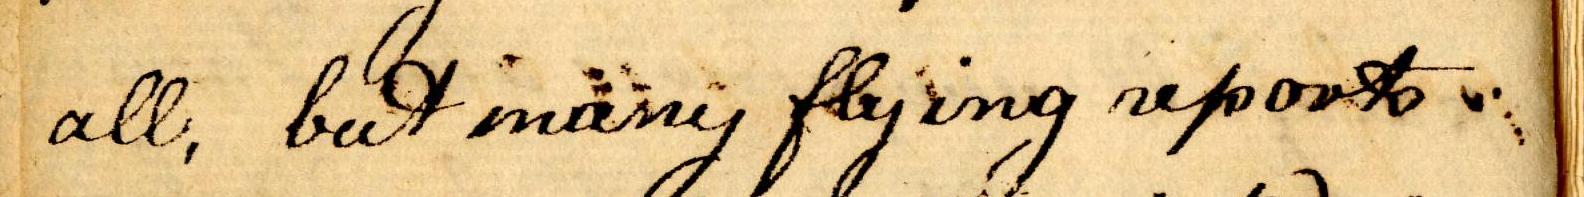all, but many flying reports.
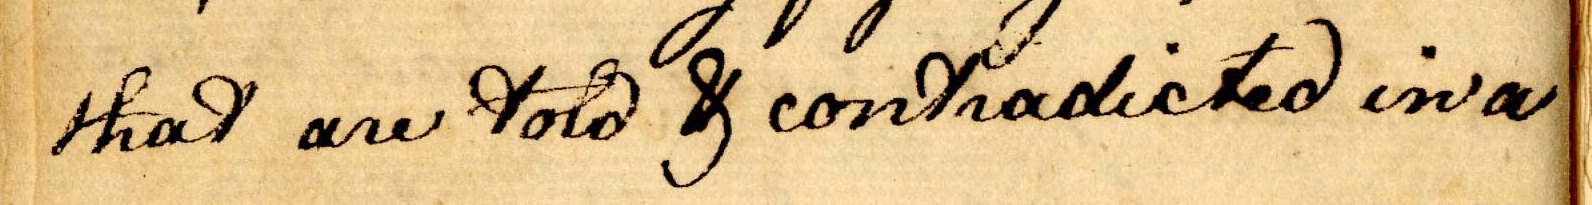that are told & contradicted in a
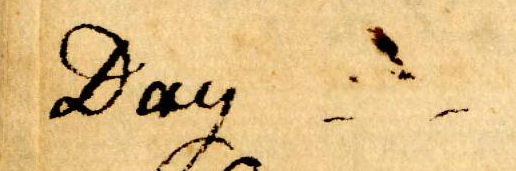Day-
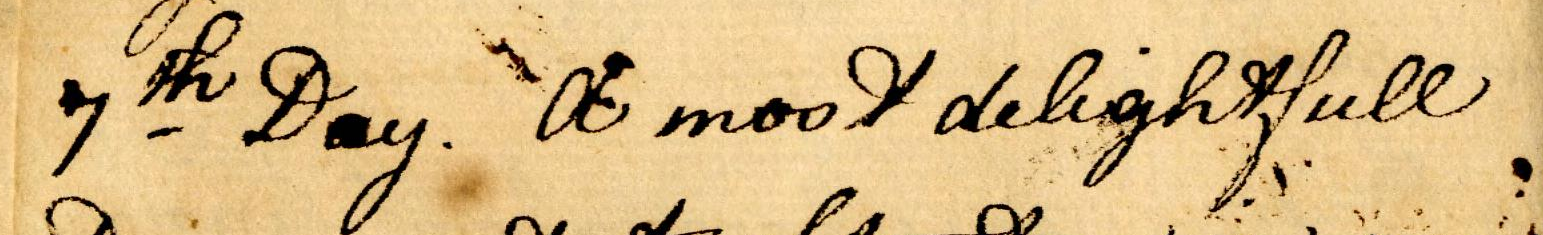7^th Day. A most delightfull
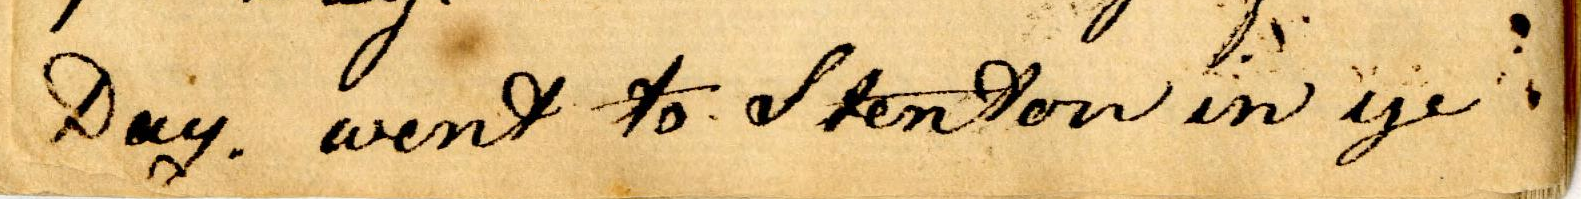Day. went to Stenton in ye
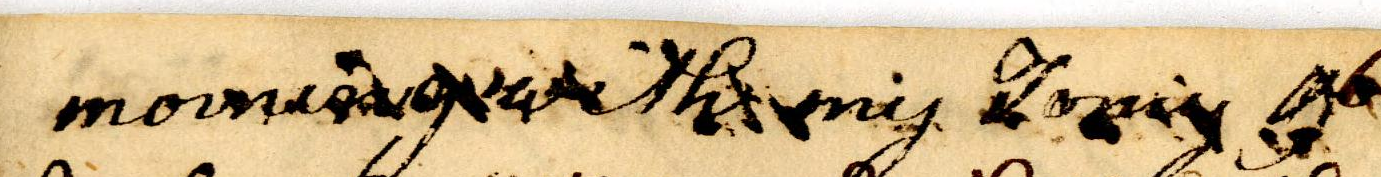morning with my Tomy &
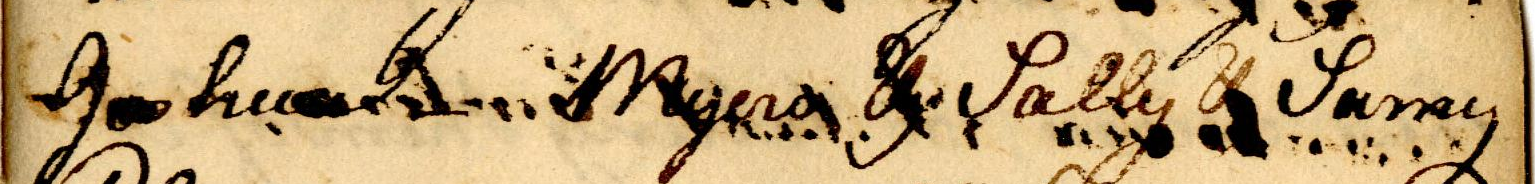Joshua Myers & Sally & Samy
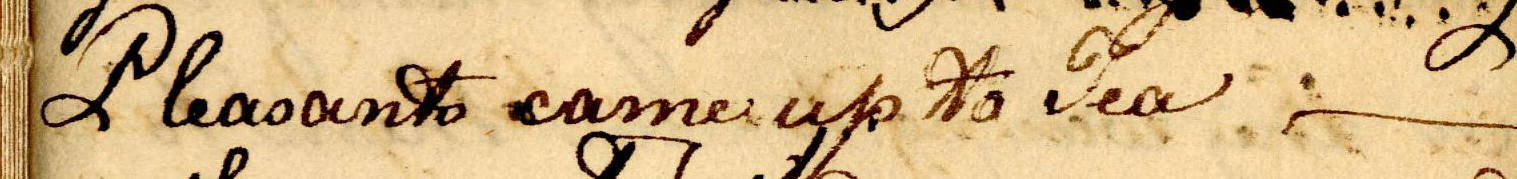Pleasants came up to Tea-
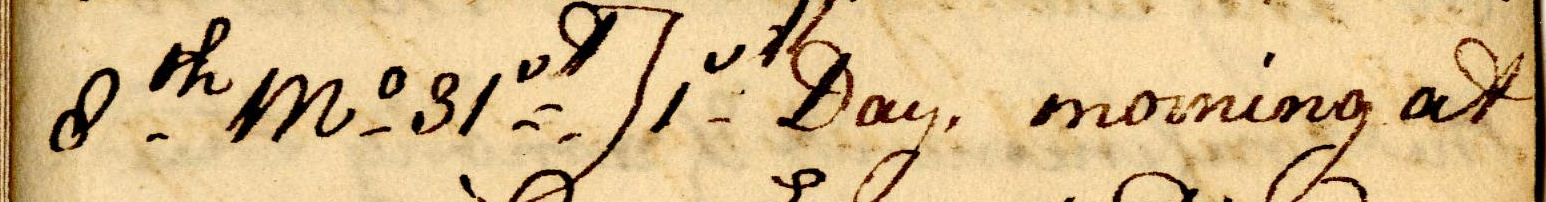8^th M^o 31^st ) 1^st Day. morning at
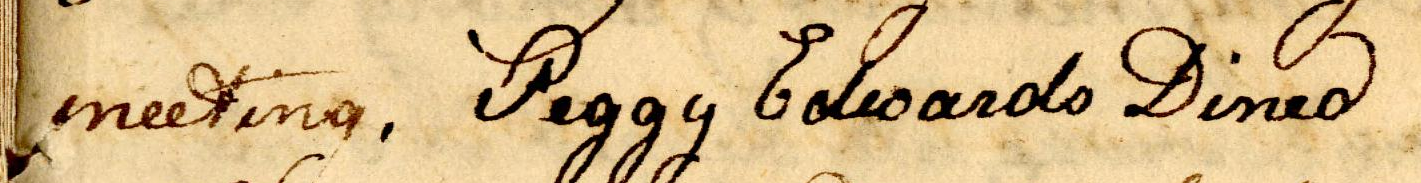meeting, Peggy Edwards Dined
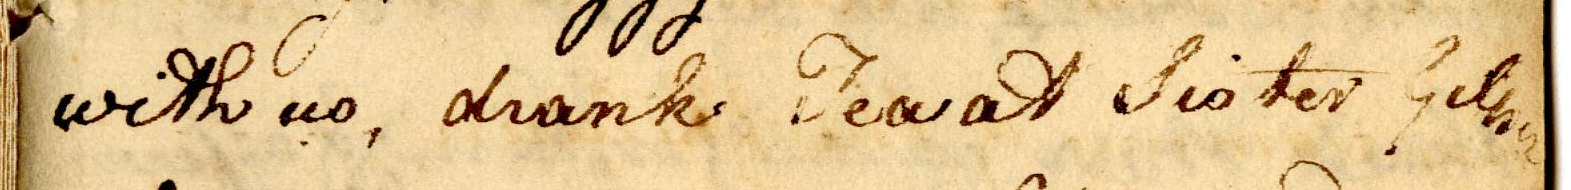with us, drank Tea at Sister Gilpin
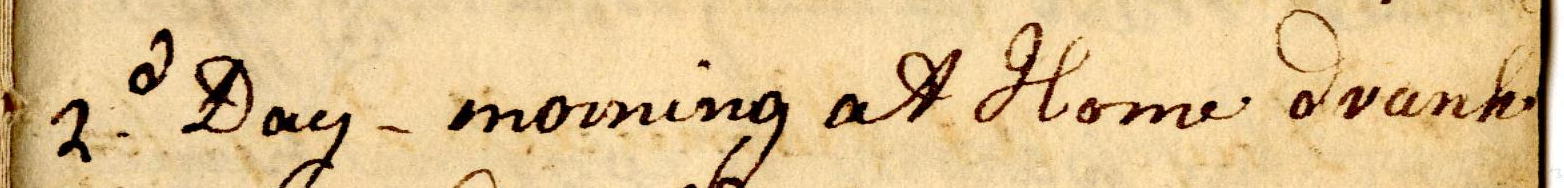2^d. Day- morning at Home drank
